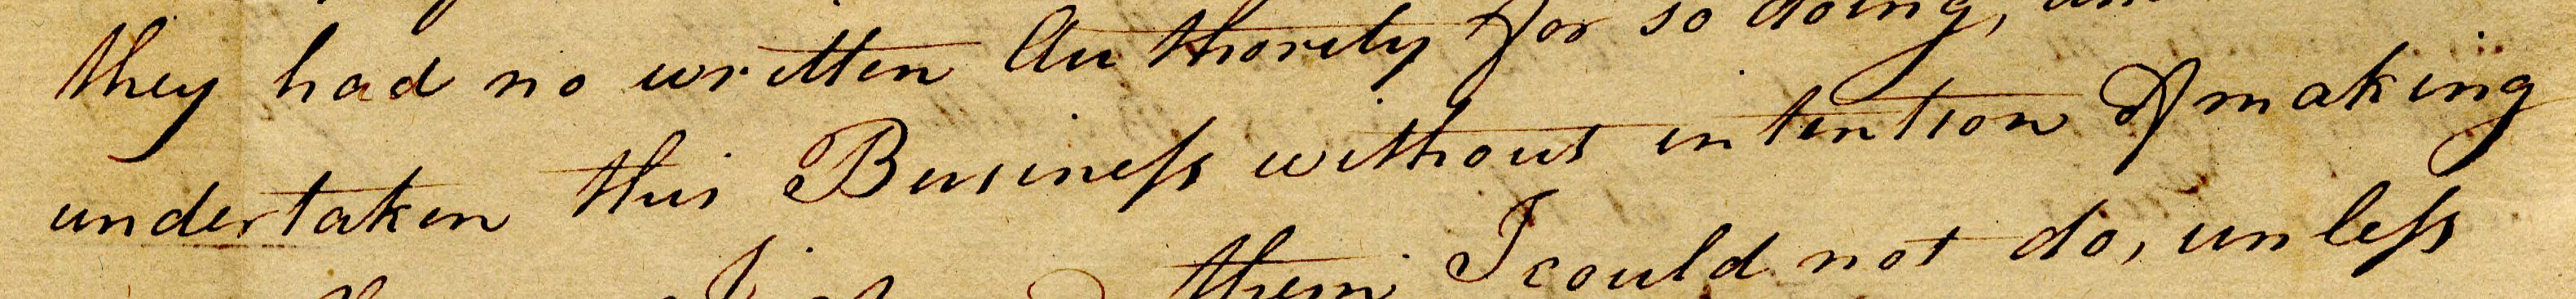undertaken this Business without intention of making
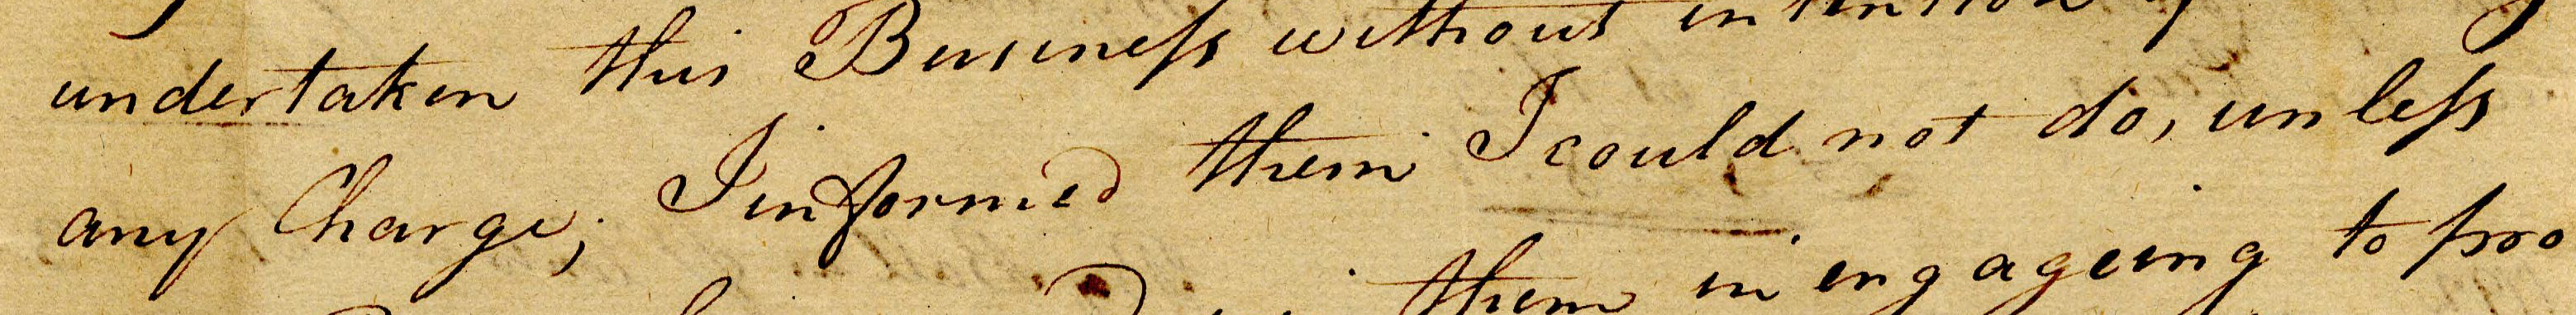any Charge, I informed them I could not do, unless
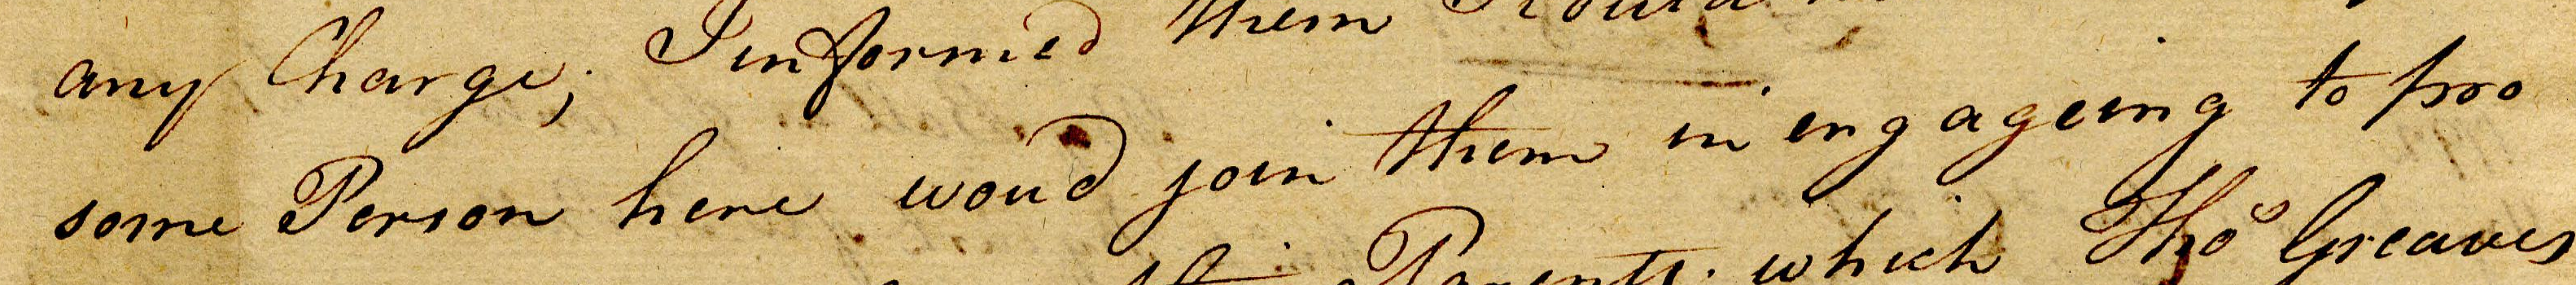some Person here would join them in engageing to pro
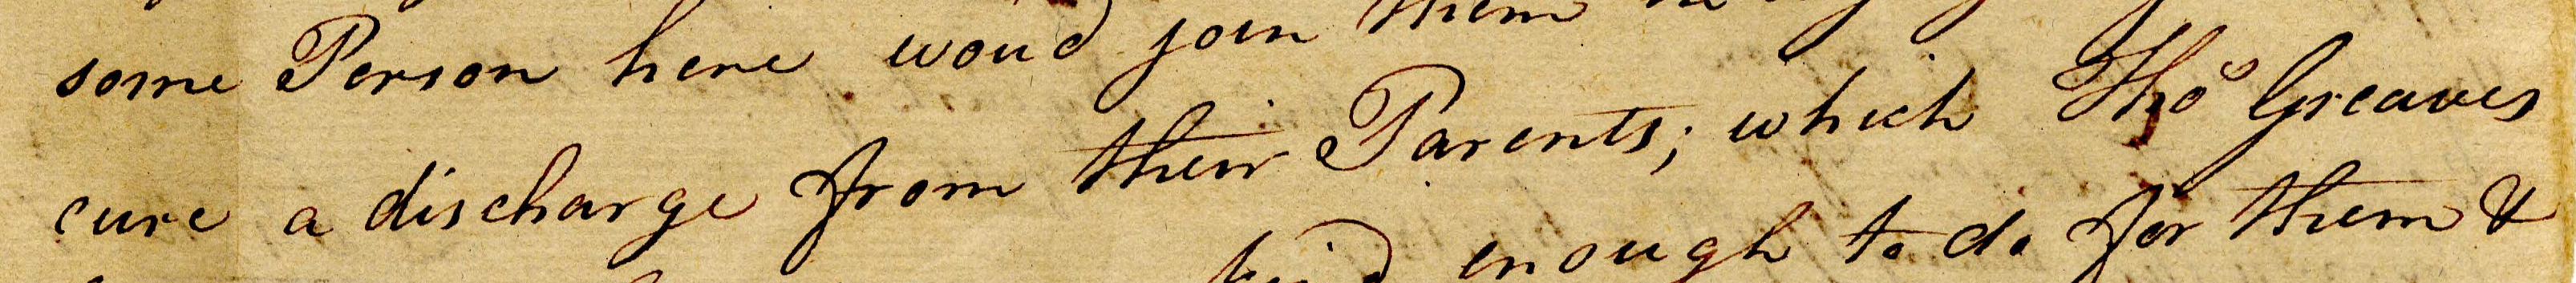cure a discharge from their Parents; which Tho^s Greaves
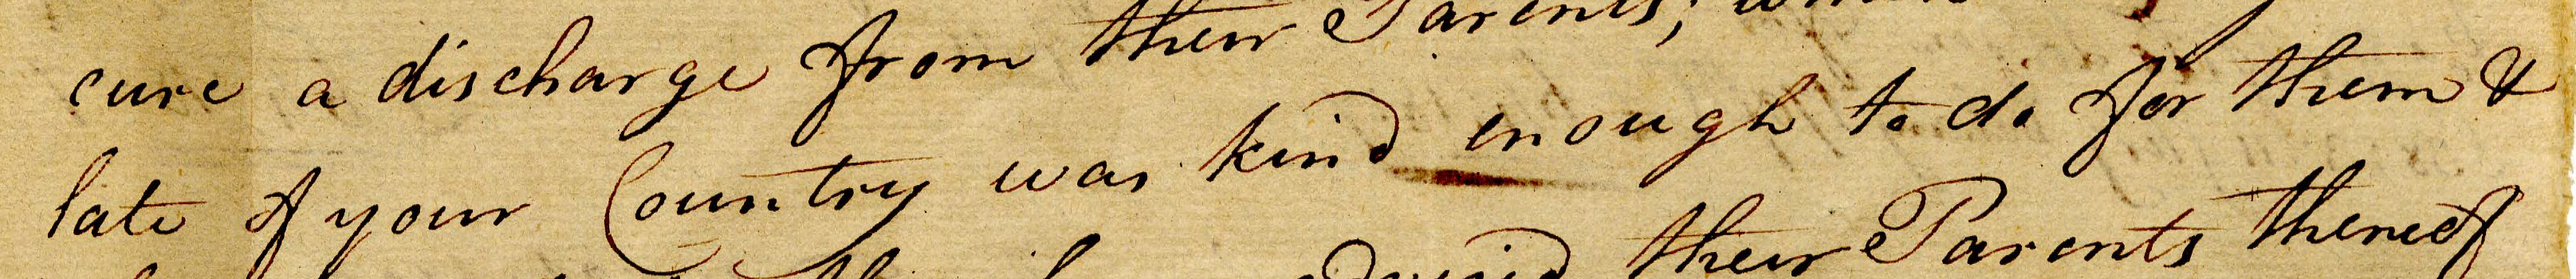late of your Country was kind enough to do for them &
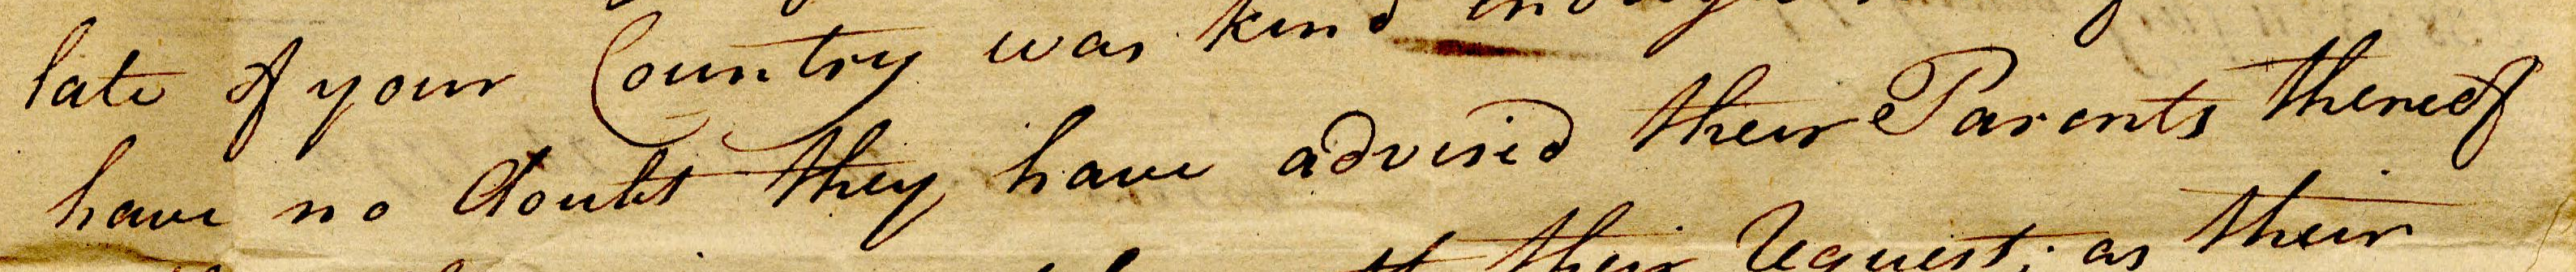have no doubts they have advised their Parents thereof
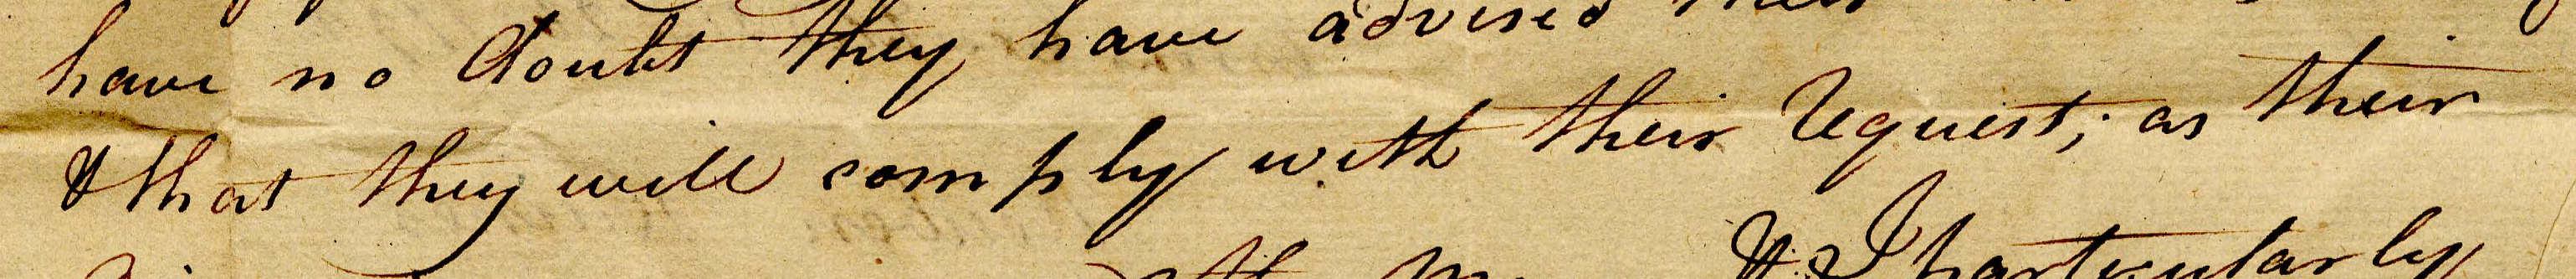& that they will comply with their requests; as their
